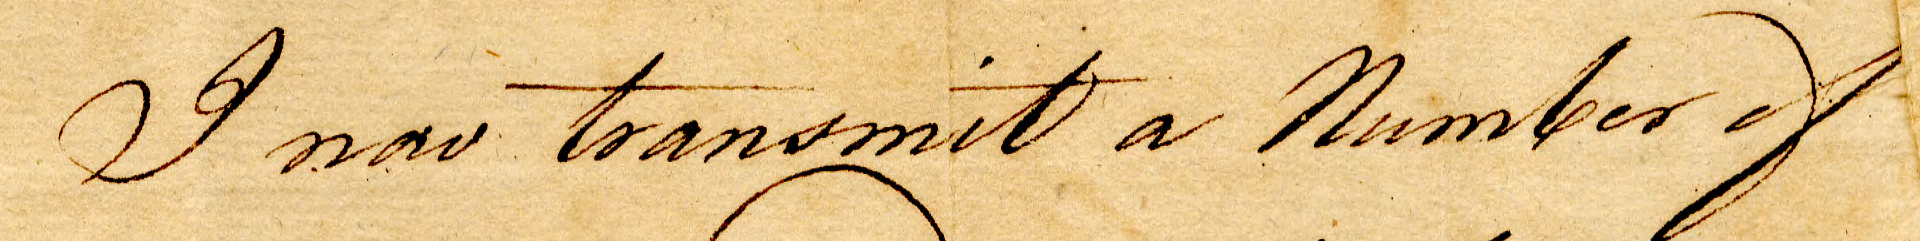I now transmit a Number of
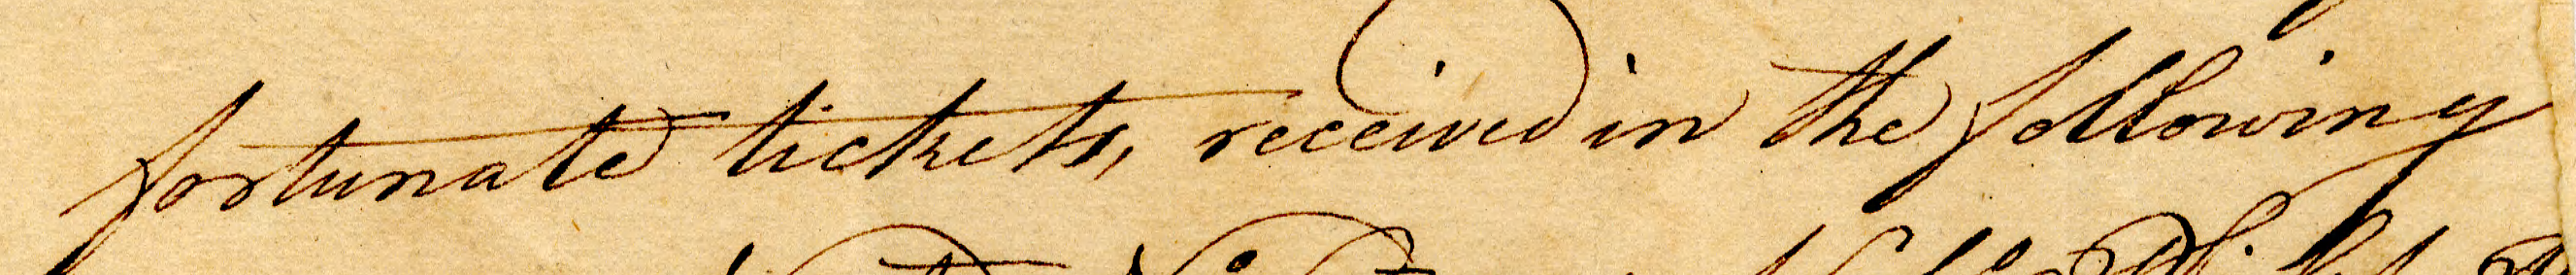fortunate tickets received in the following
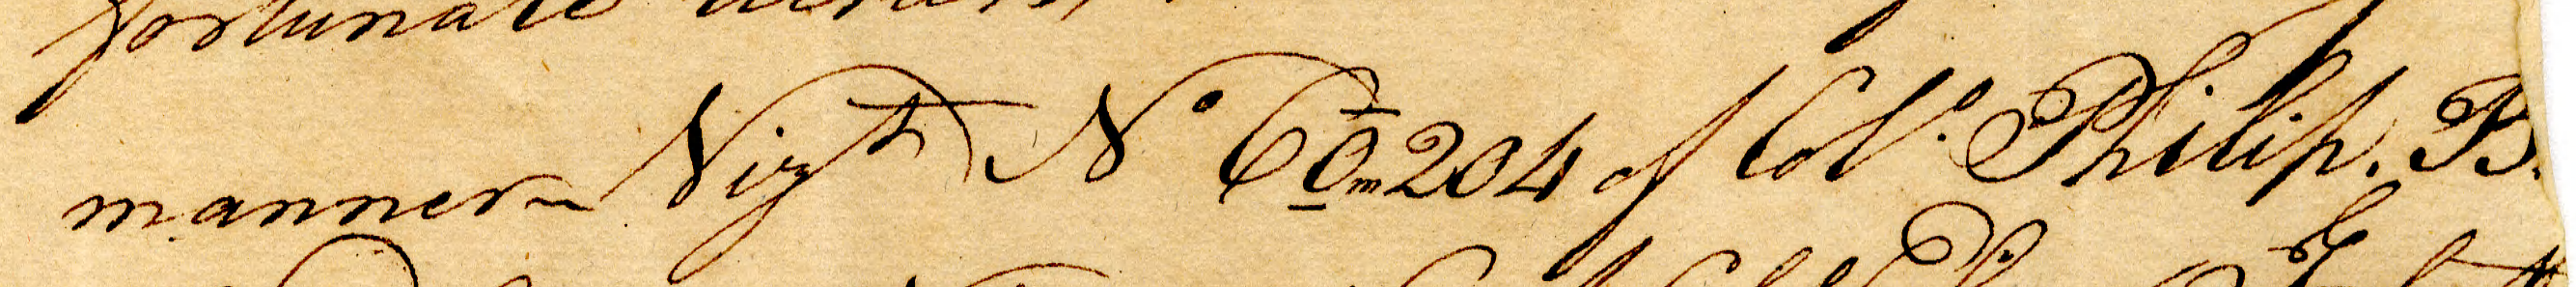manner-Viz^t N^o 60^m204 of Col^o. Philip. B
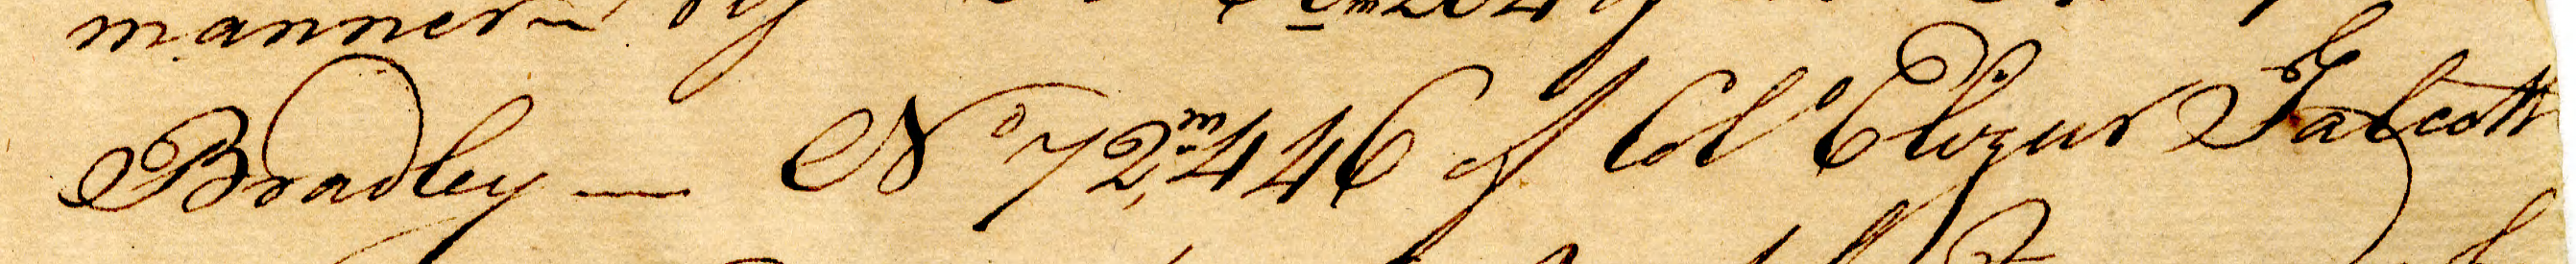Bradley- N^o 72,^m446 of Col^o Elizur Talcott
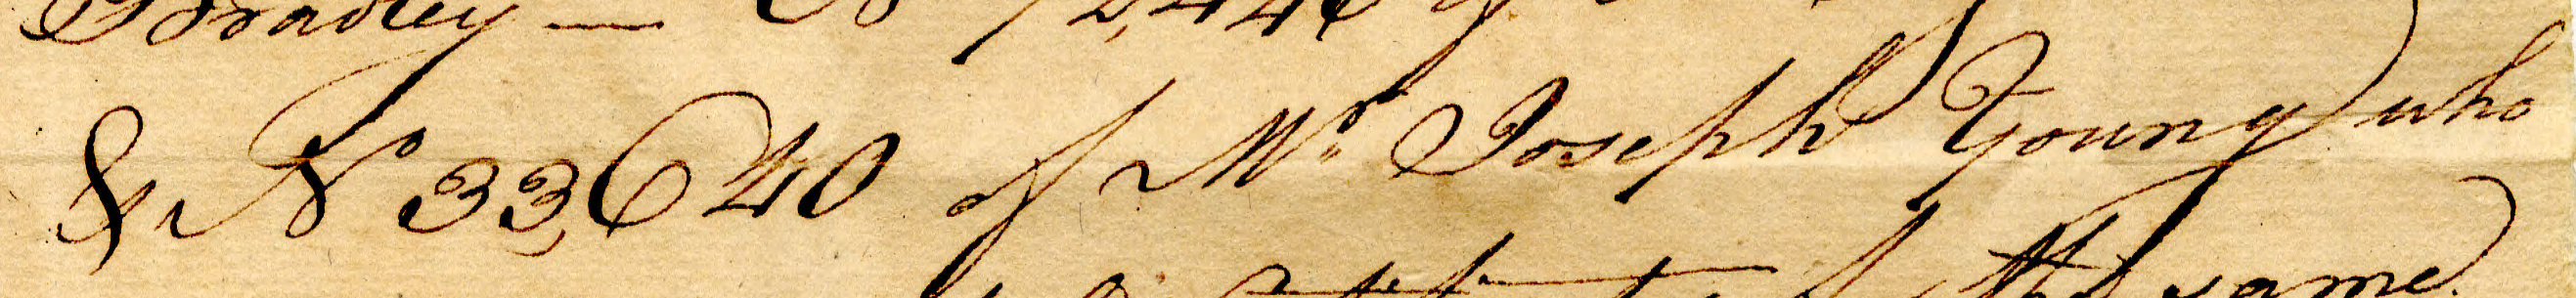& N 33,640 of M^r. Joseph Young who
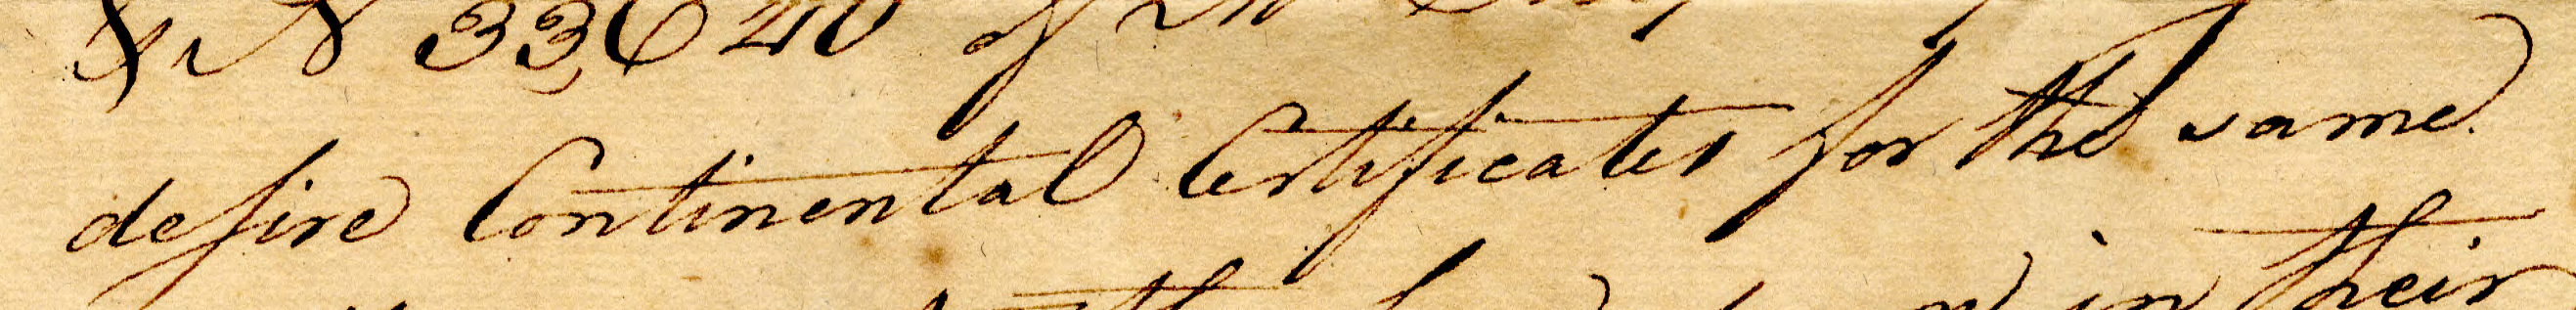desire Continental Certificates for the same
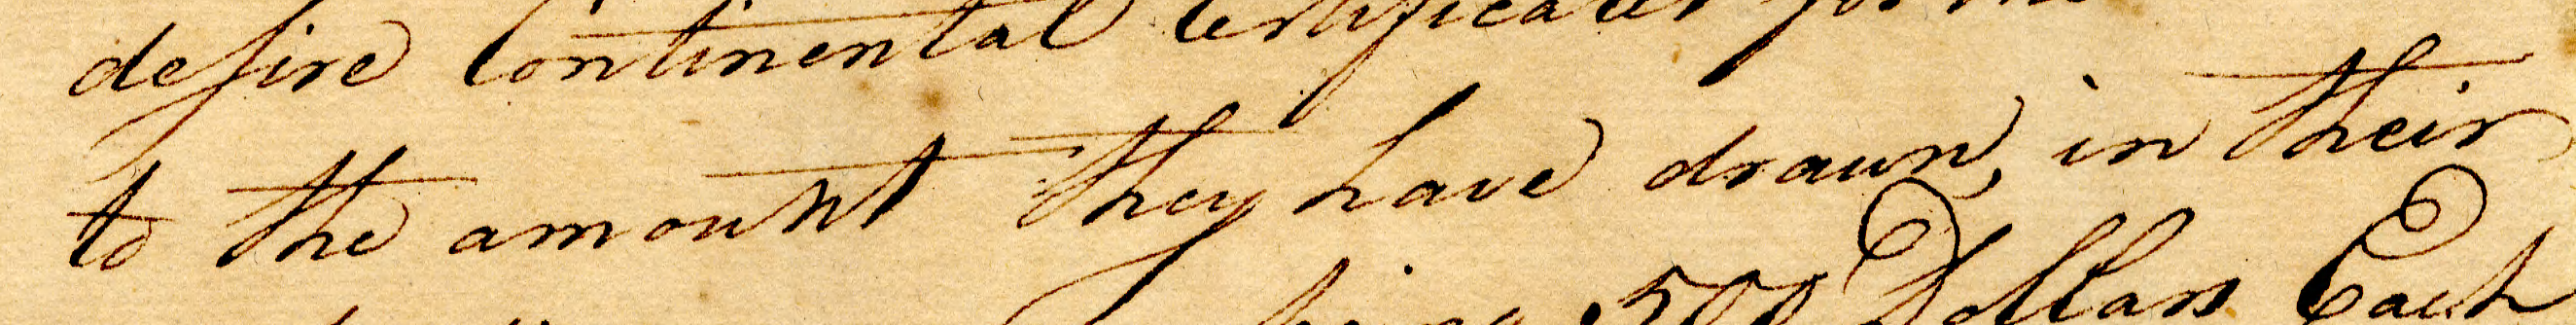to the amount they have drawn in their
